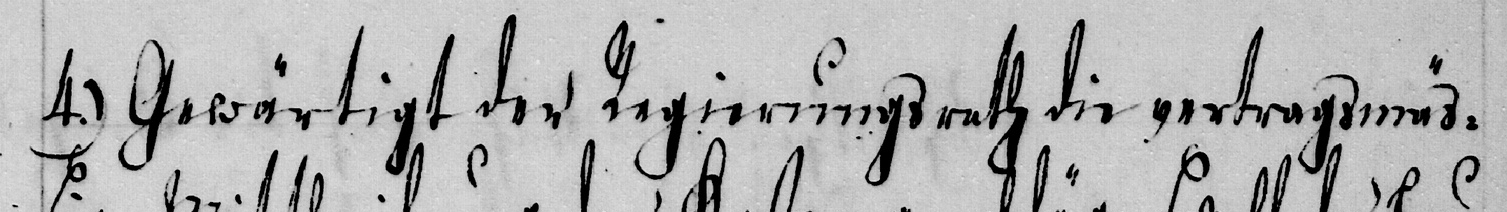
4.) Gewärtigt der Regierungsrath die vertragsmäß¬
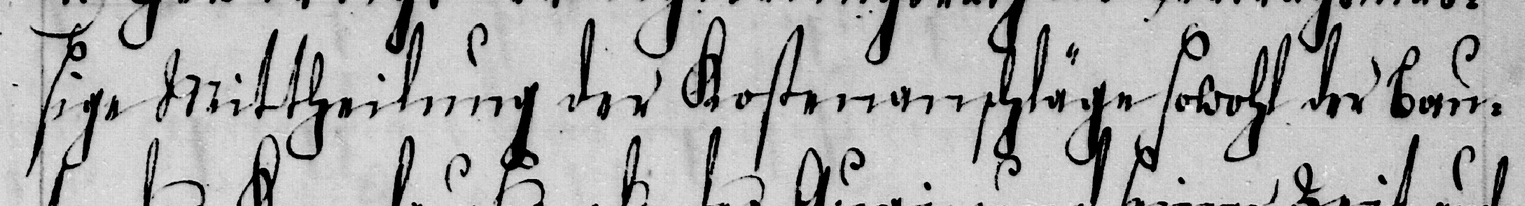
ige Mittheilung der Kostenanschläge sowohl der Bau¬
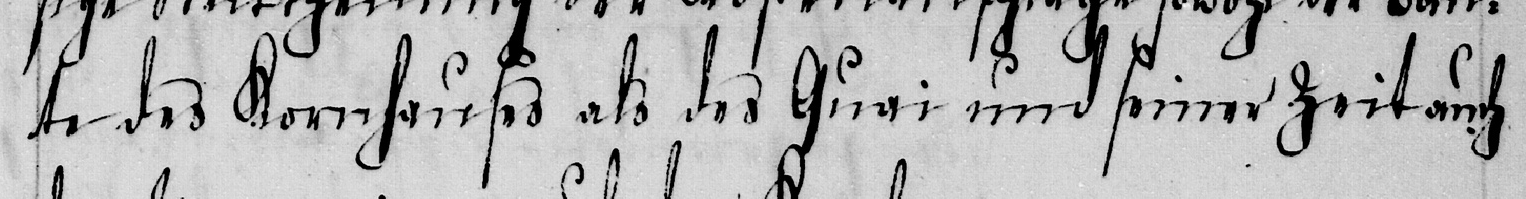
te des Kornhauses als des Quai und seiner Zeit auch
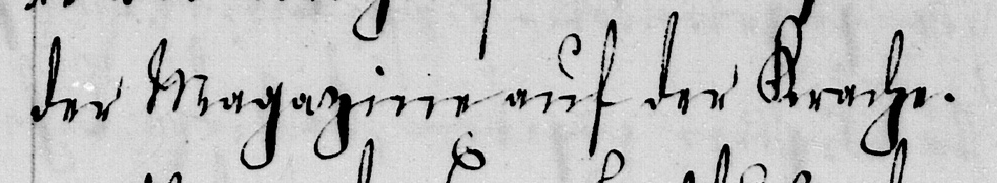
der Magazine auf der Krache.
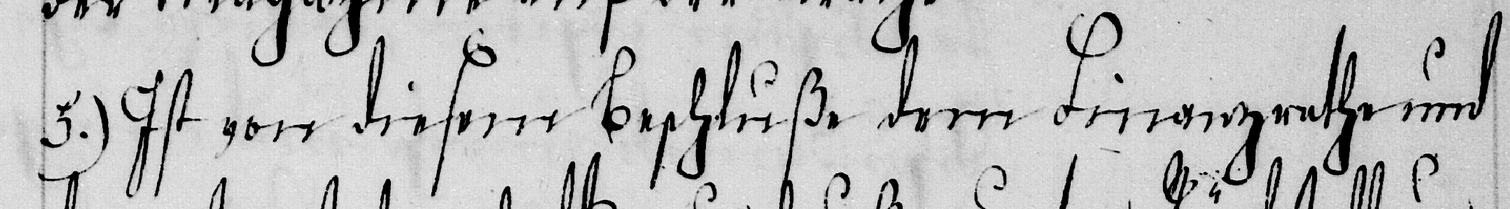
5.) Ist von diesem Beschluße dem Finanzrathe und
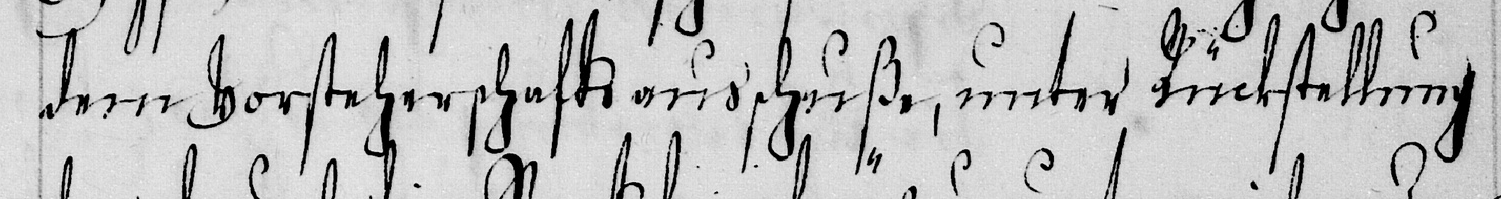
dem Vorsteherschaftsausschuße, unter Rückstellung
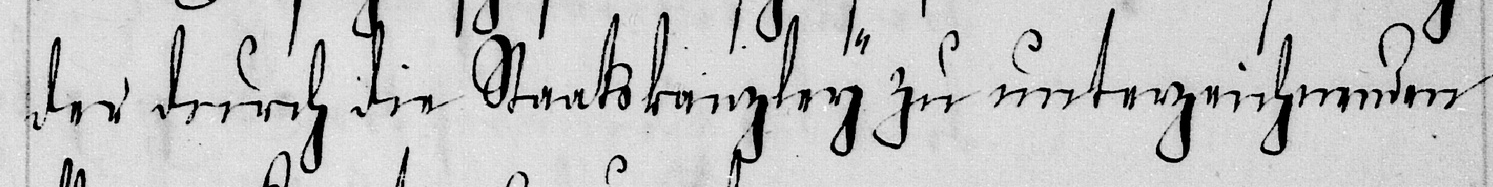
der durch die Staatskanzley zu unterzeichnenden
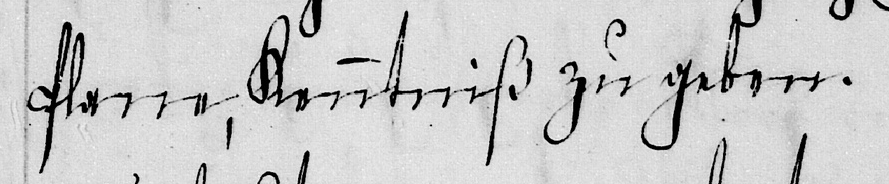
Plane, Kenntniß zu geben.
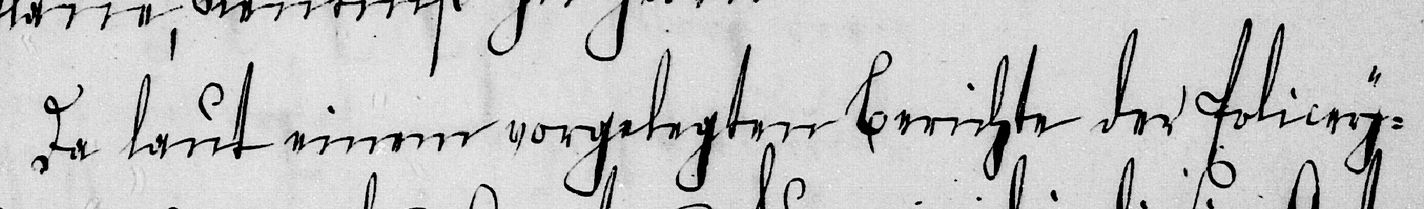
Da laut einem vorgelegten Berichte der Police¬
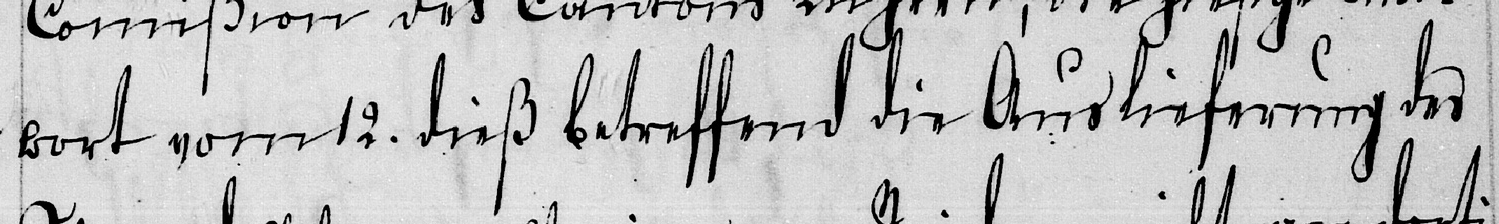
wort vom 12. dieß betreffend die Auslieferung des
